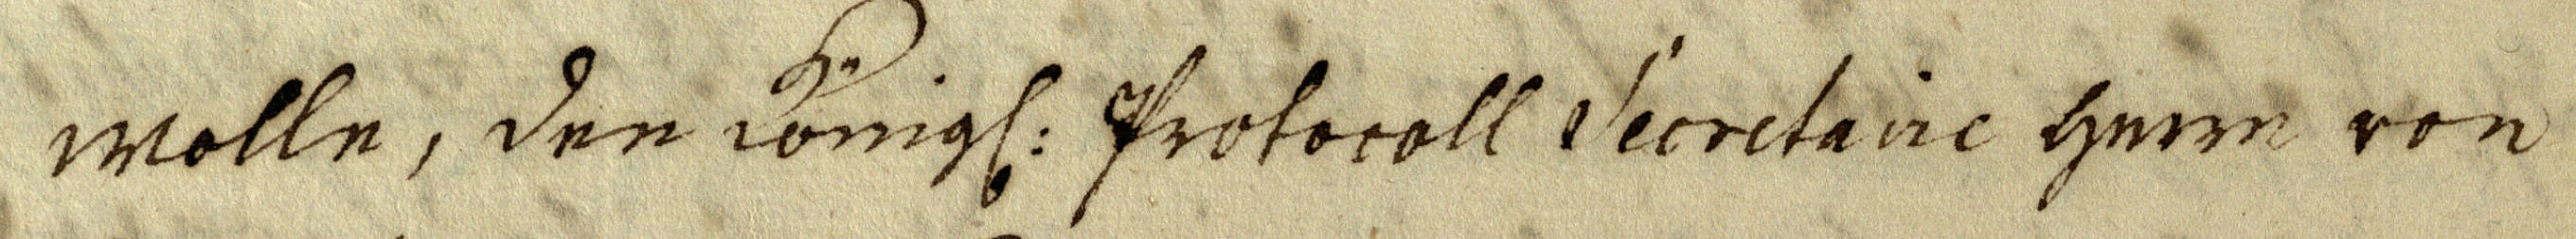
wolle, den Königl. Protocoll Secretaire Herrn von
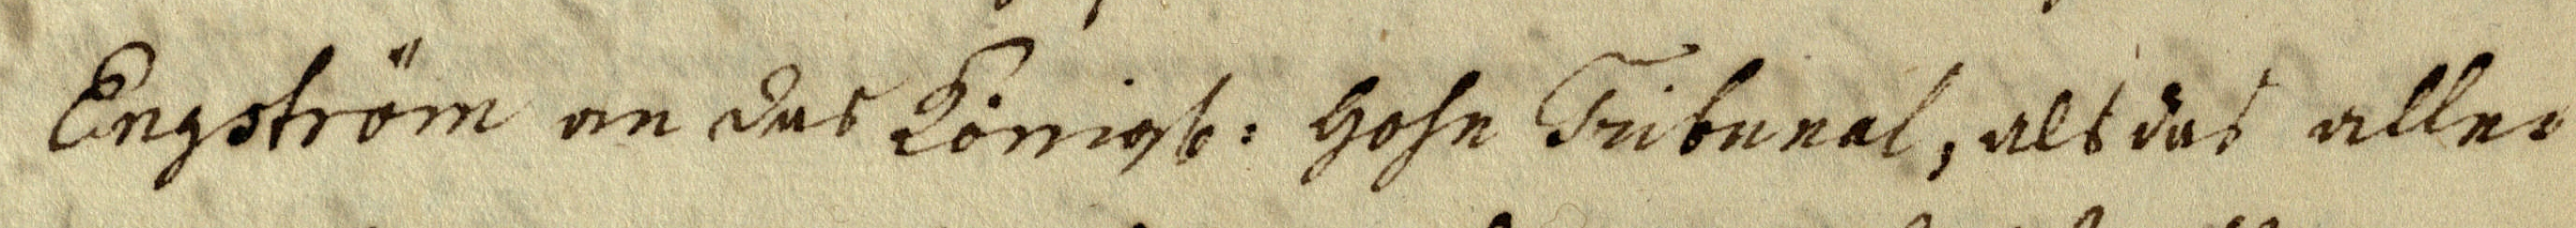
Engström an das Königl. Hohe Tribunal, als das allei¬
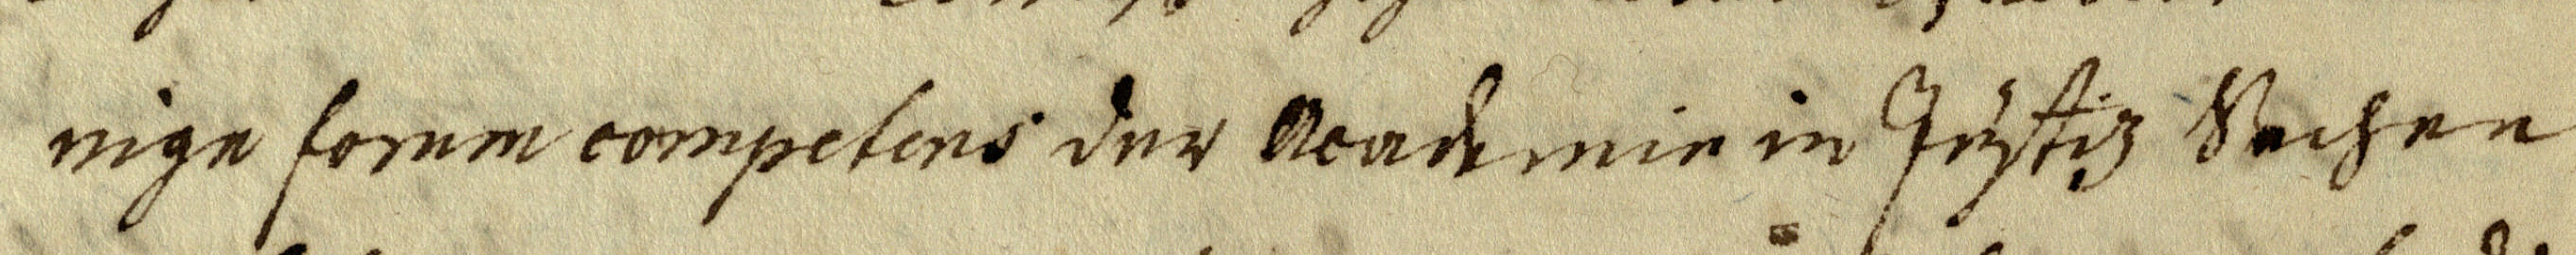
nige forum competens der Academie in Justiz Sachen
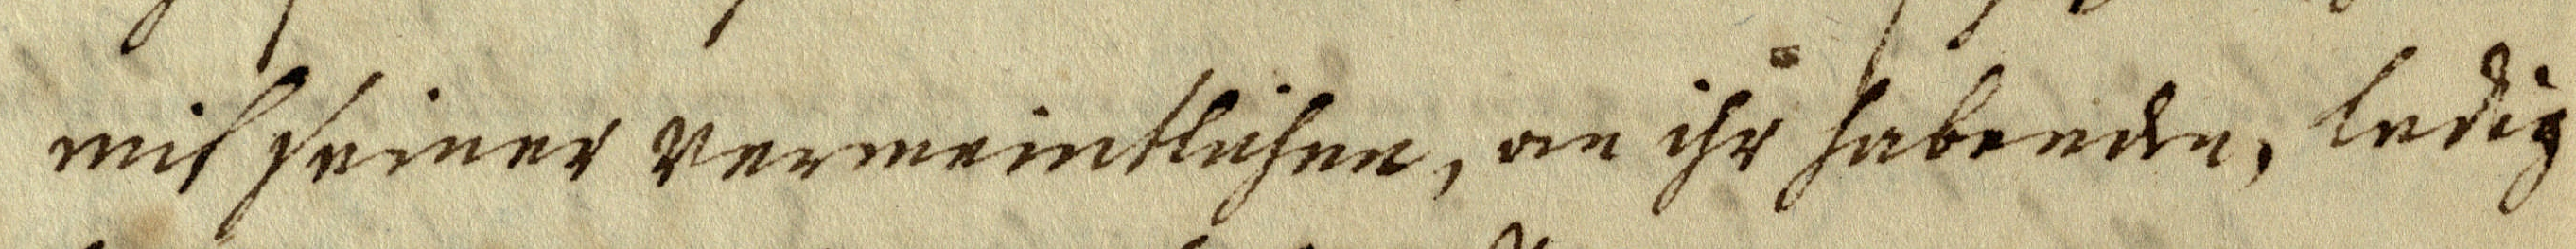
mit seiner vermeintlichen, an ihr habenden, ledig¬
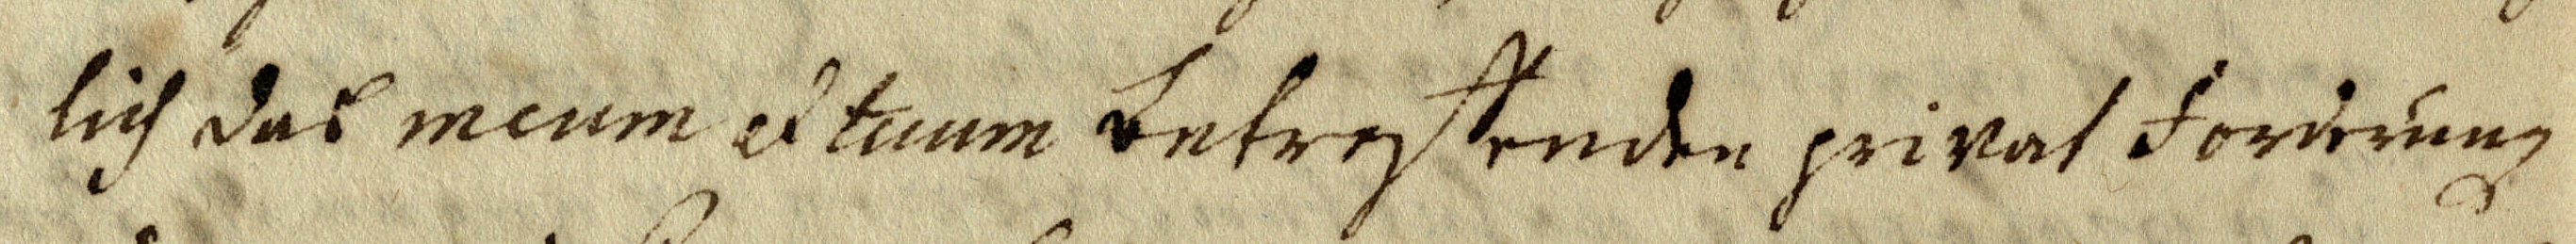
lich das meum et tuum betreffenden privat forderung
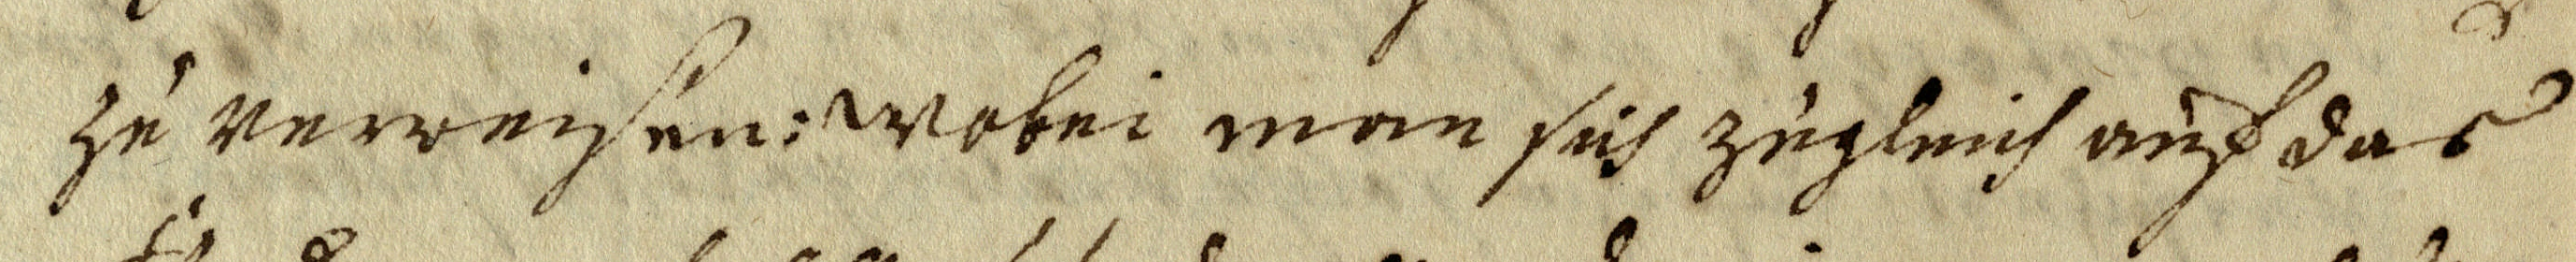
zu verweisen, wobei man sich zugleich auf das
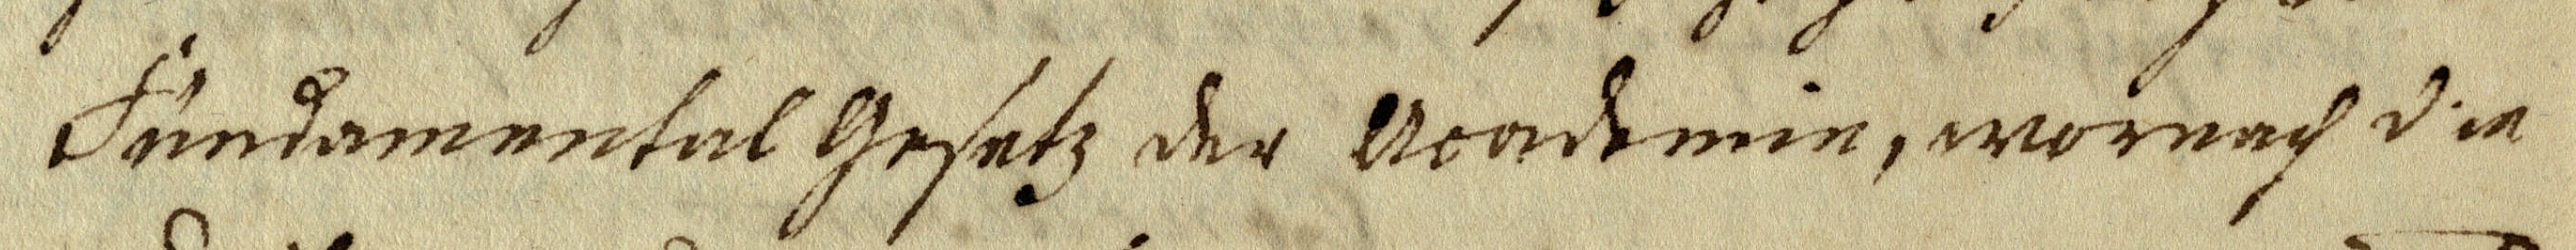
Fundamental Gesetz der Academie, worauf die
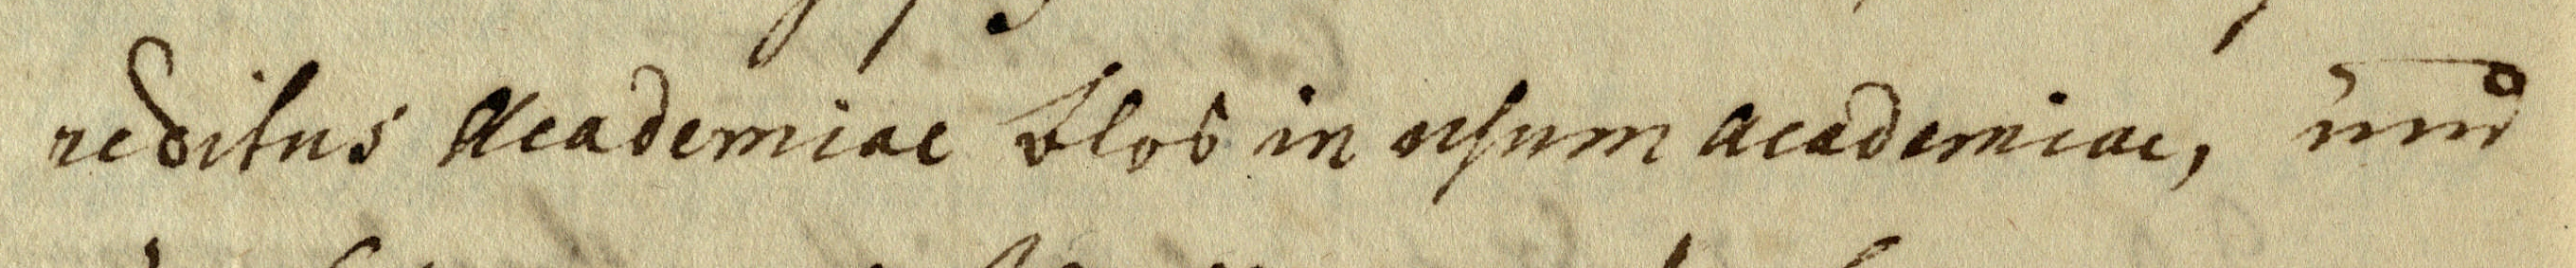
reditus Academiae blos in ehem Academiae,
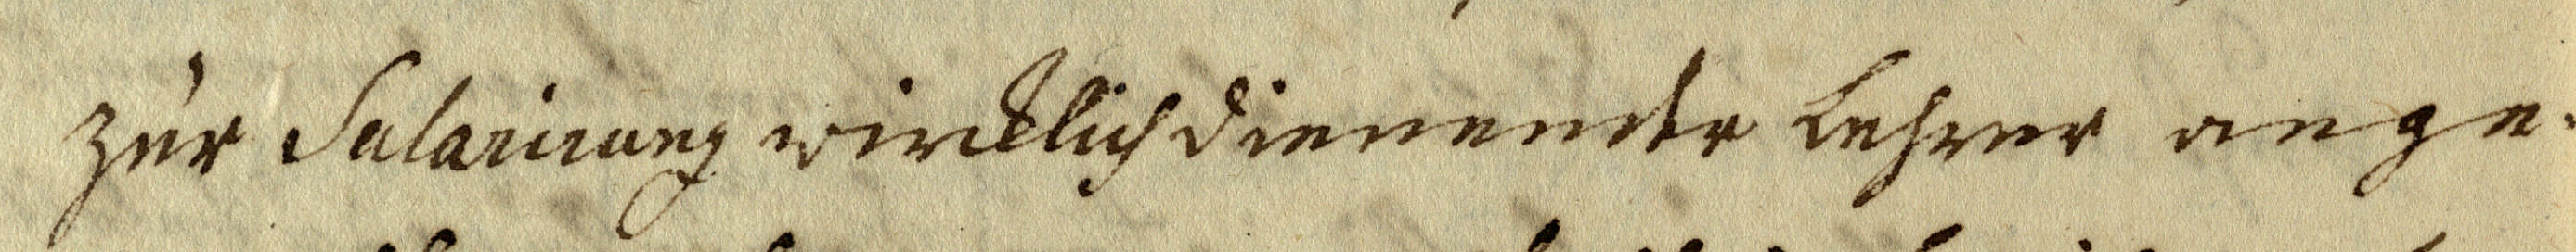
zur Salarirung wircklich dienender Lehrer ange¬
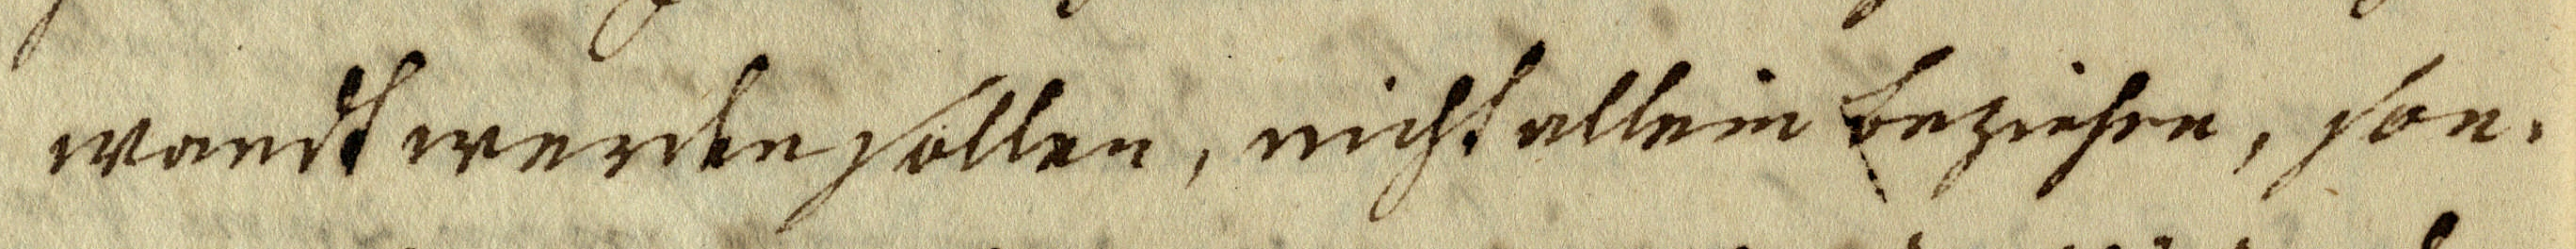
wandt werden sollen, nicht allein beziehen, son¬
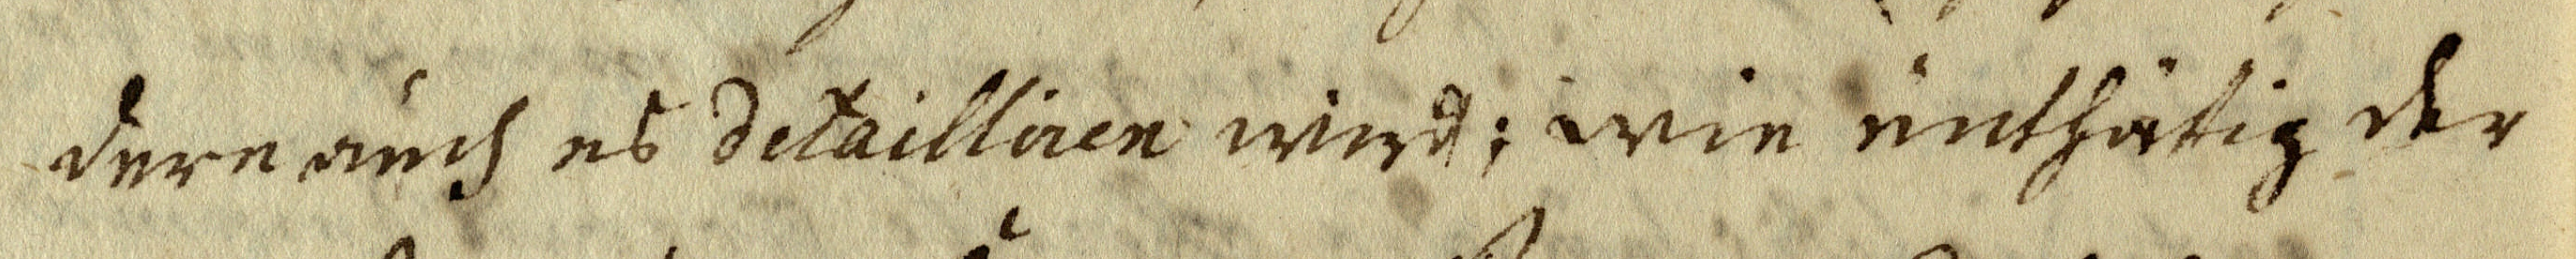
dern auch es detailliren wird, wie unthätig der
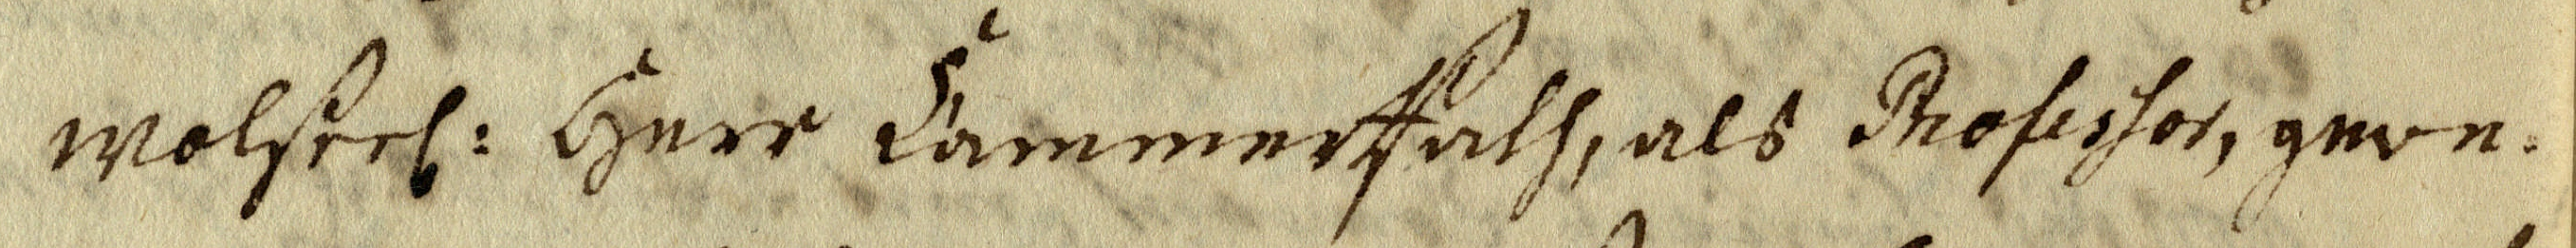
wolseel. Herr CammerRath, als Professor, gewe¬
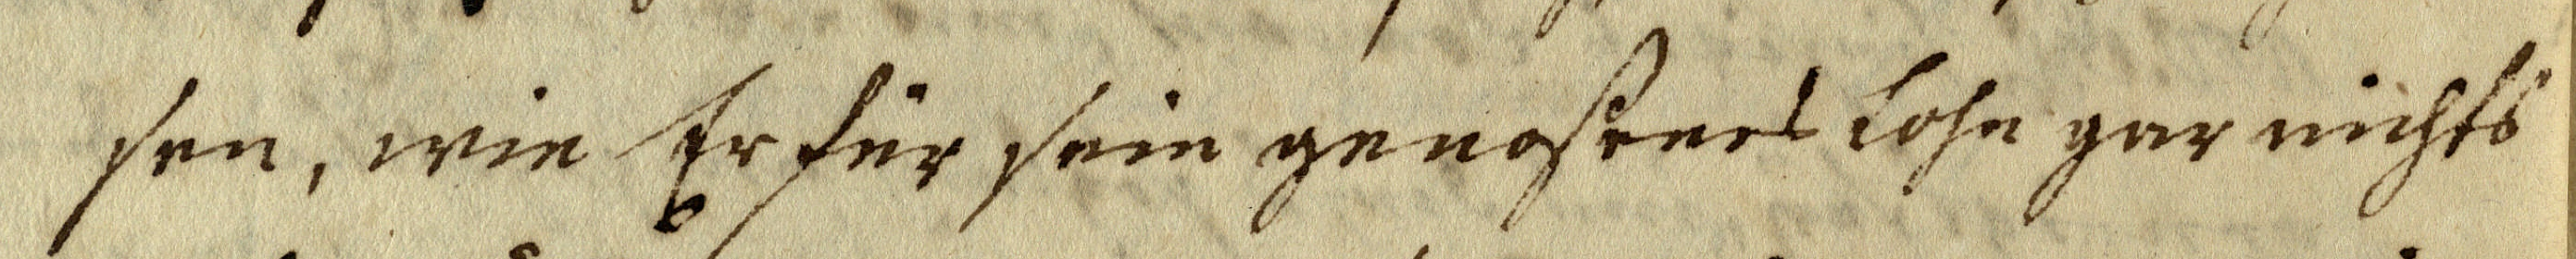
sen, wie Er für sein genoßenes Lohn gar nichts
